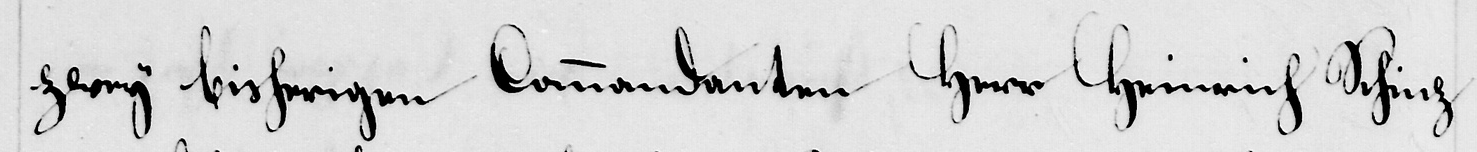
zwey bisherigen Commandanten Herr Heinrich Schinz
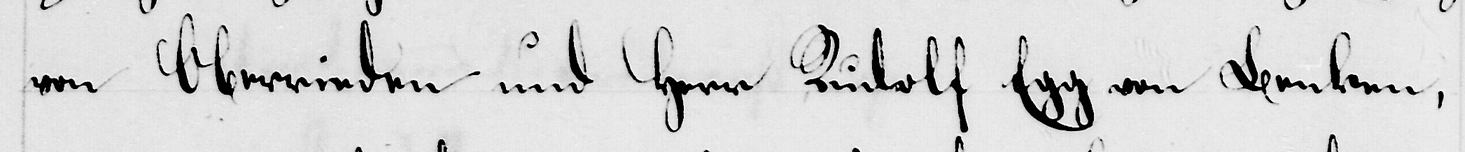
von Oberrieden und Herrn Rudolf Egg von Benken,
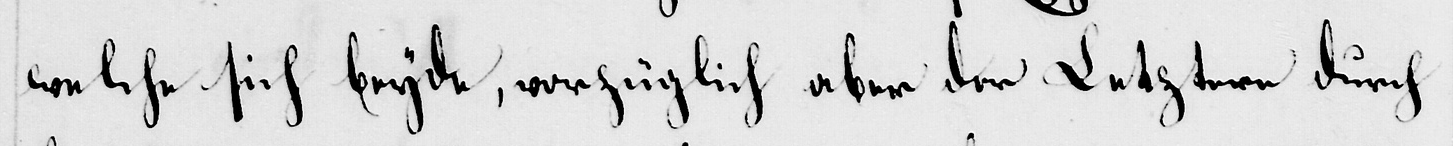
welche sich beyde, vorzüglich aber der Letztere durch
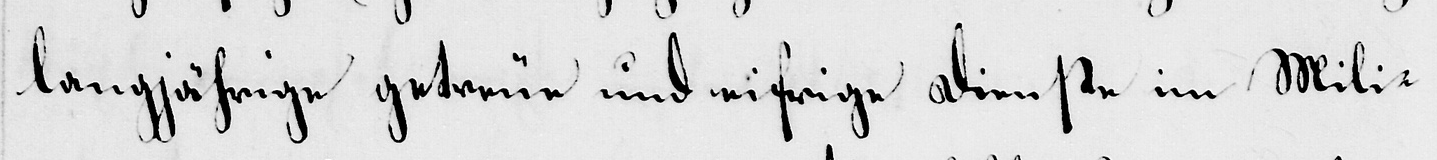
langjährige getreue und eifrige Dienste im Mili¬
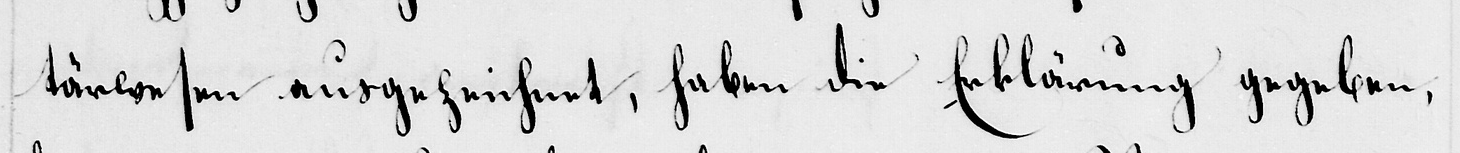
tärwesen ausgezeichnet, haben die Erklärung gegeben,
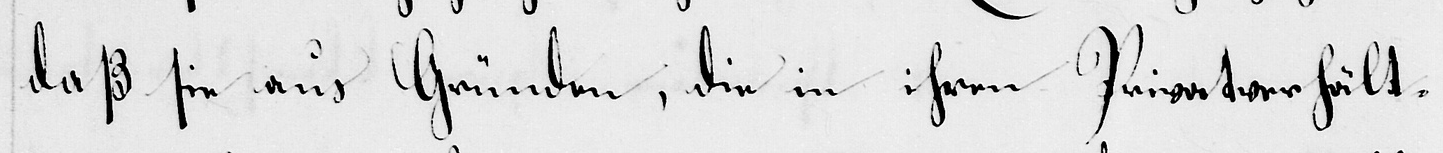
daß sie aus Gründen, die in ihren Privatverhält¬
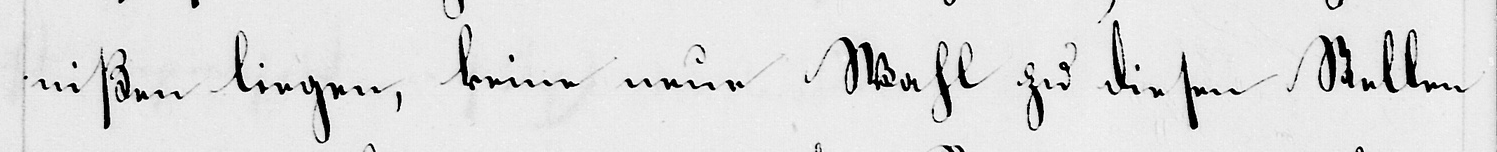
nißen liegen, keine neue Wahl zu diesen Stellen
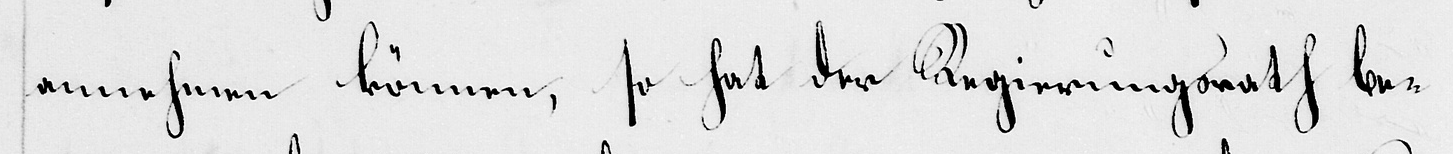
annehmen können, so hat der Regierungsrath be¬
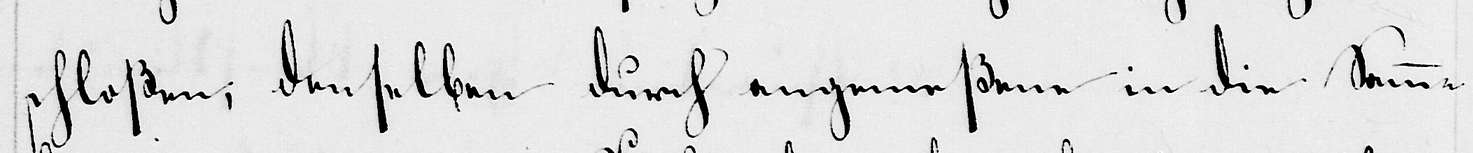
schloßen, denselben durch angemeßene in die Samm¬
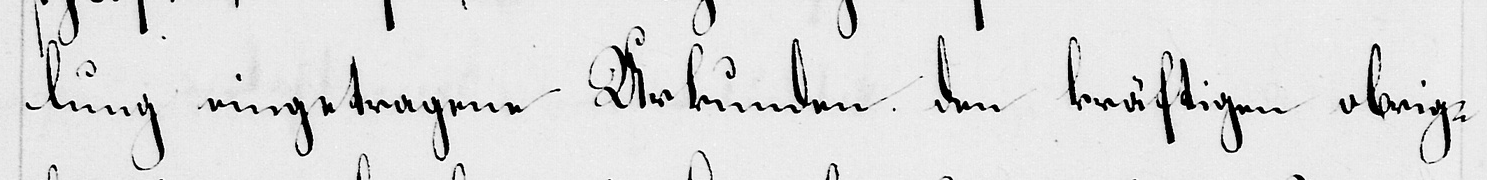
lung eingetragene Urkunden den kräftigen obrig¬
